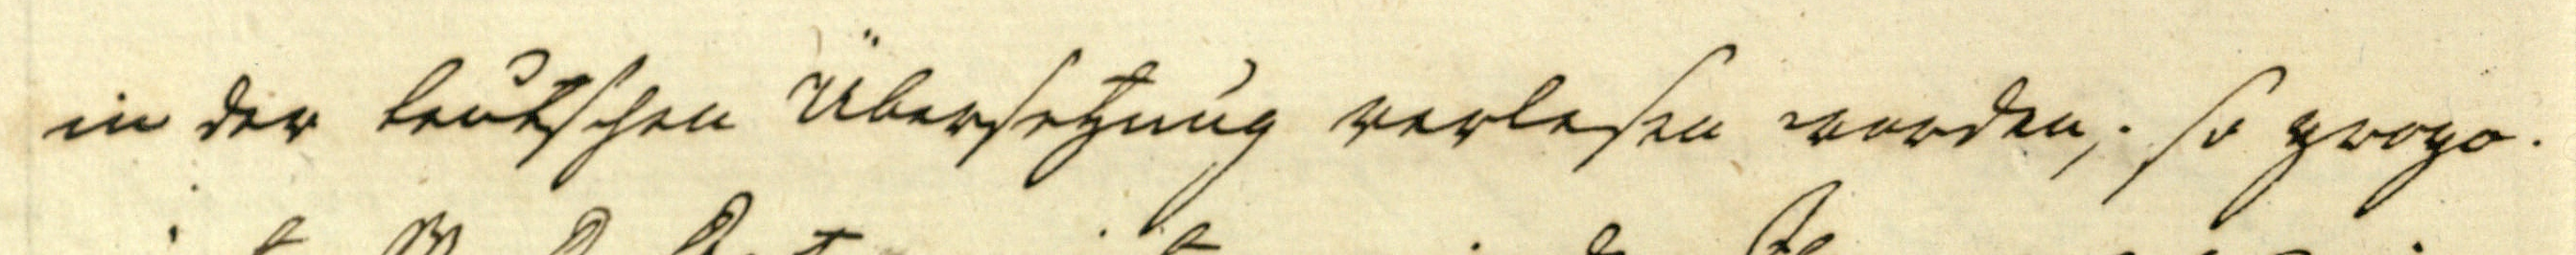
in der teutschen Übersetzung verlesen worden; so propo¬
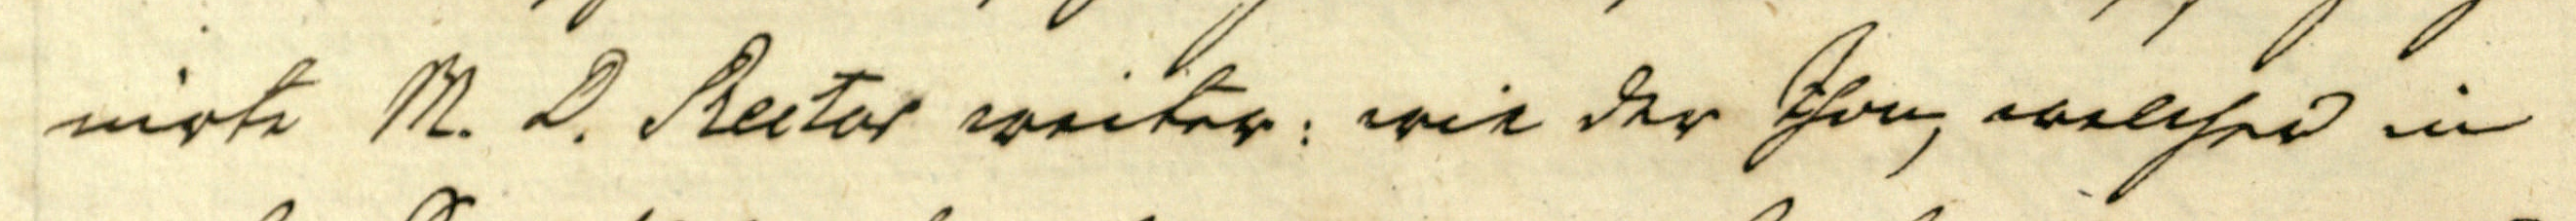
nirte M. D. Rector weiter: wie der Thon, welcher in
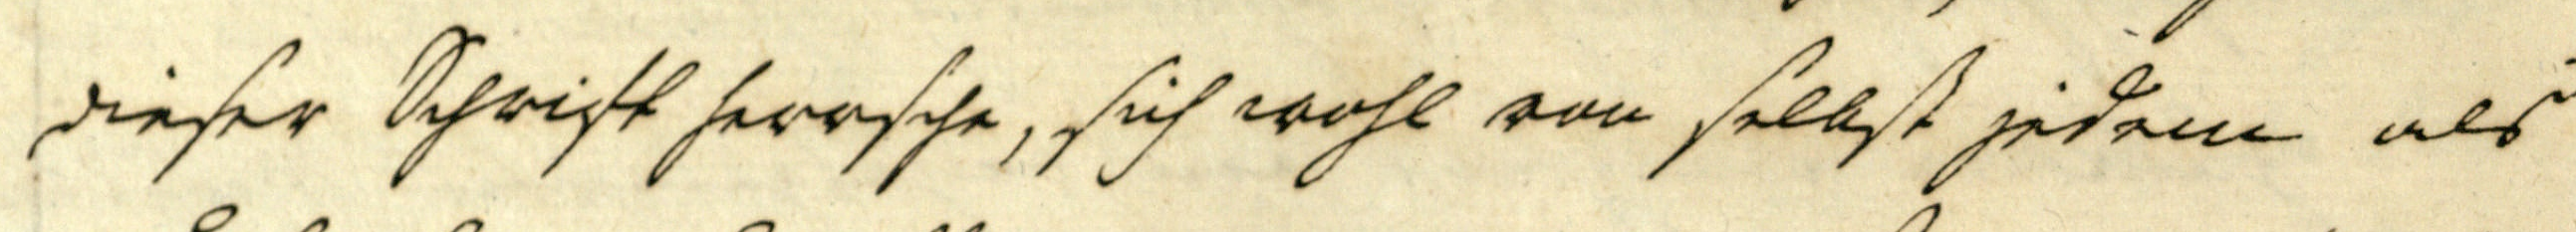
dieser Schrift herrsche, sich wohl von selbst jedem als
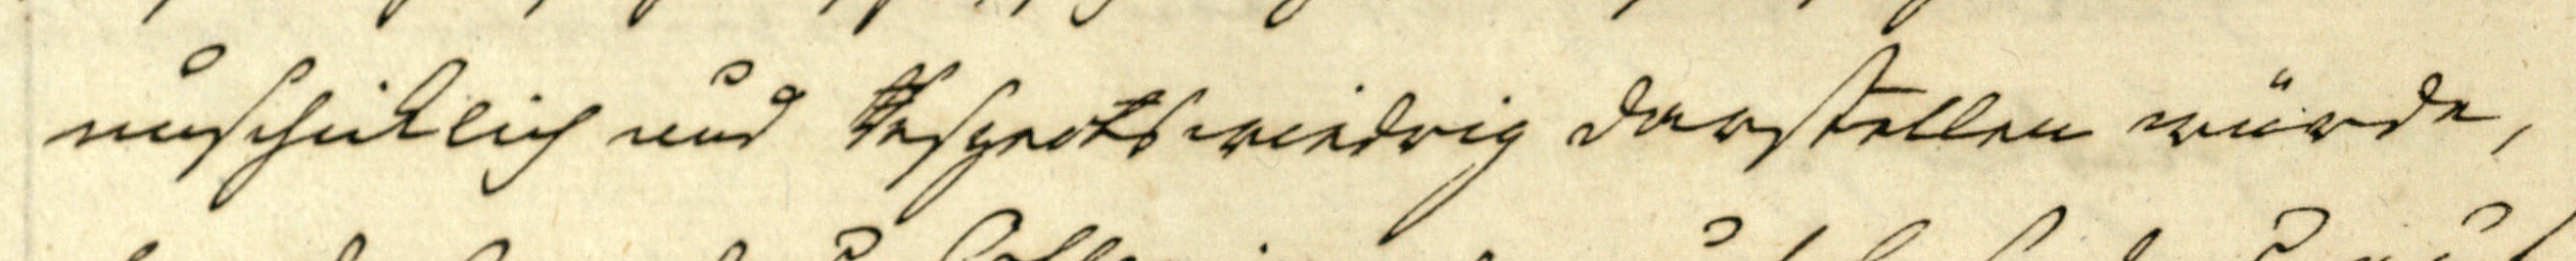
unschicklich und Respects wiedrig darstellen würde,
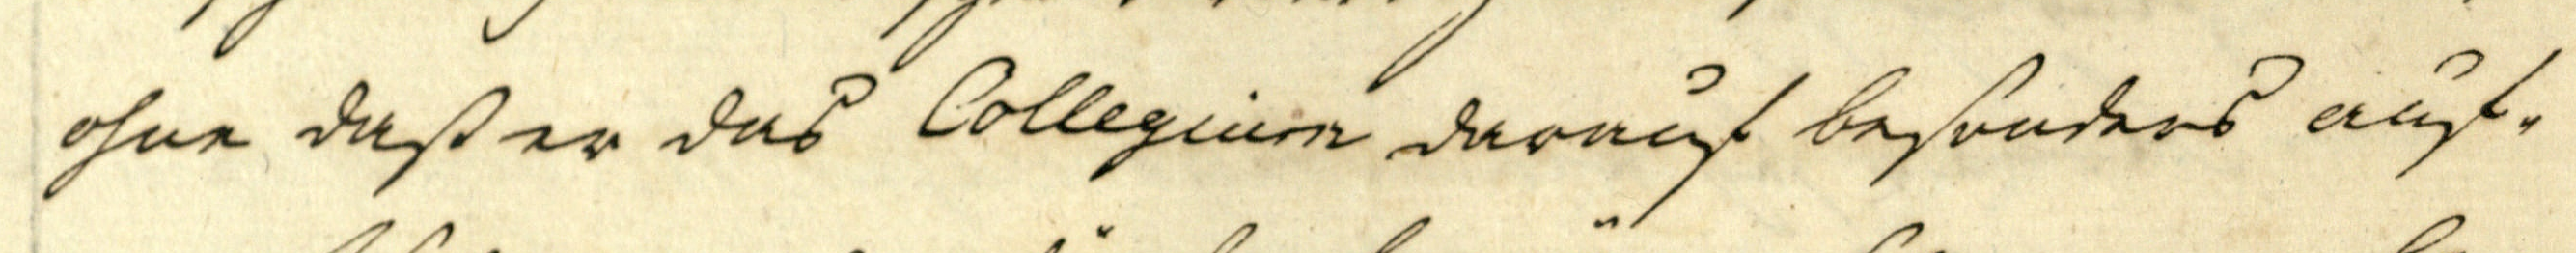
ohne daß er das Collegium darauf besonders auf¬
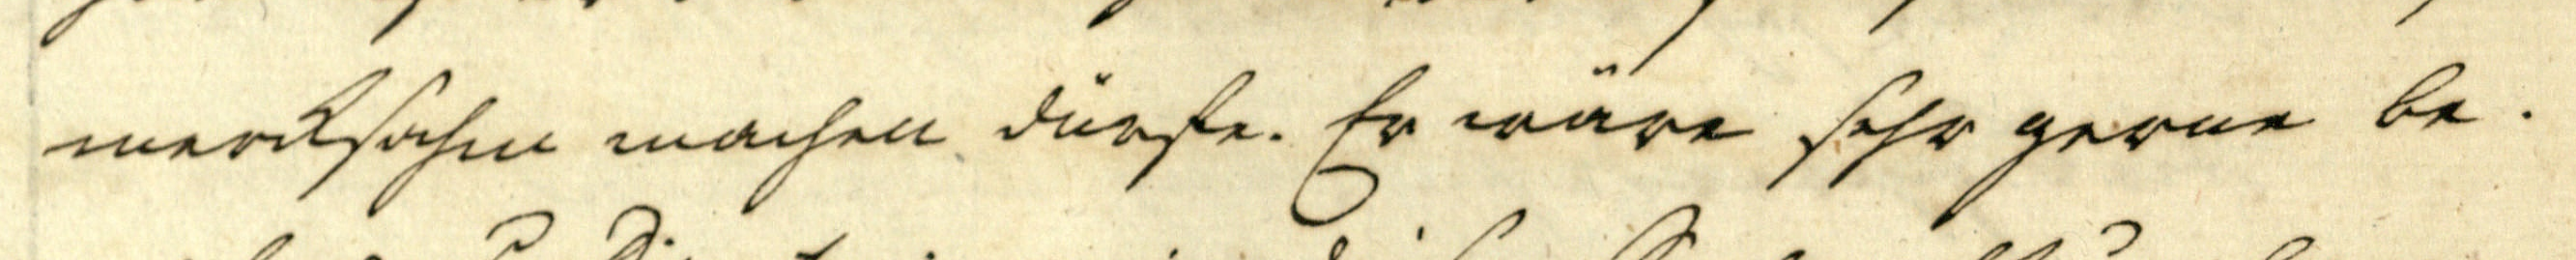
mercksahm machen dürfe. Er wäre sehr gerne be¬
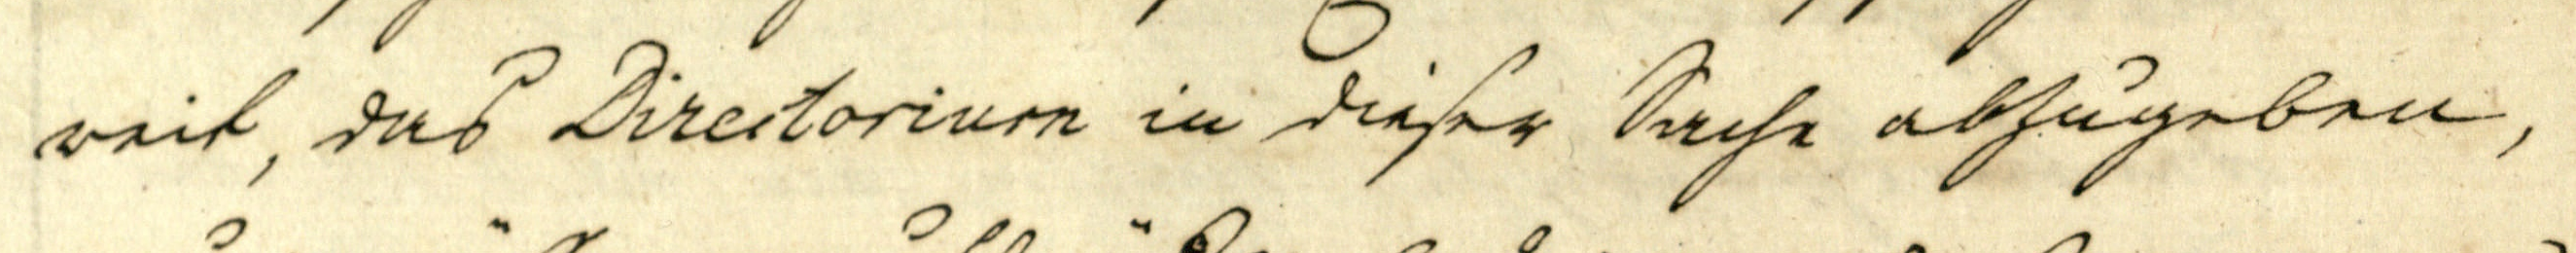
reit, das Directorium in dieser Sache abzugeben,
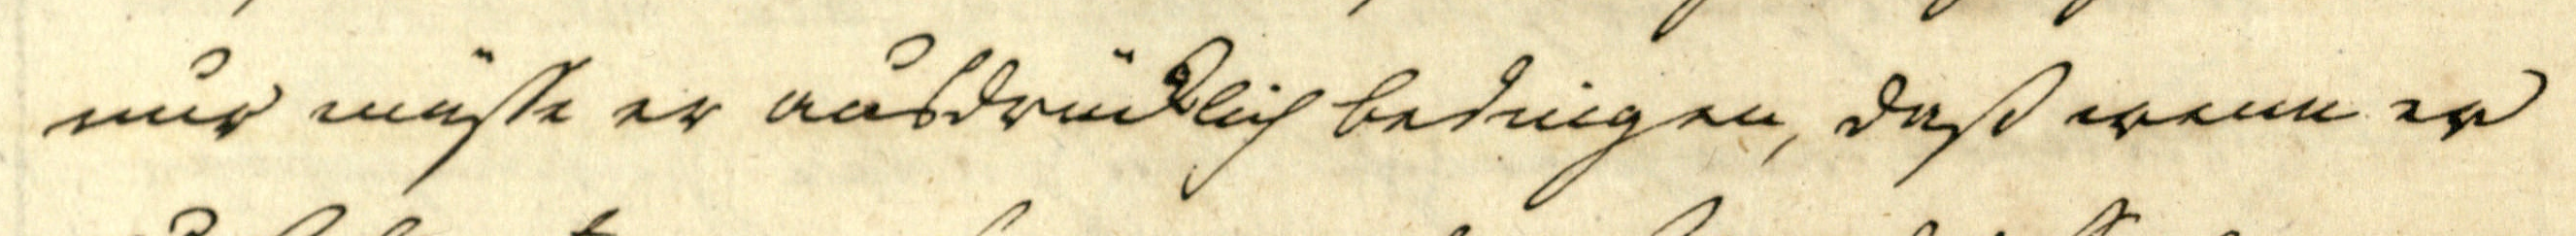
nur müsse er ausdrüklich bedingen, daß wenn er
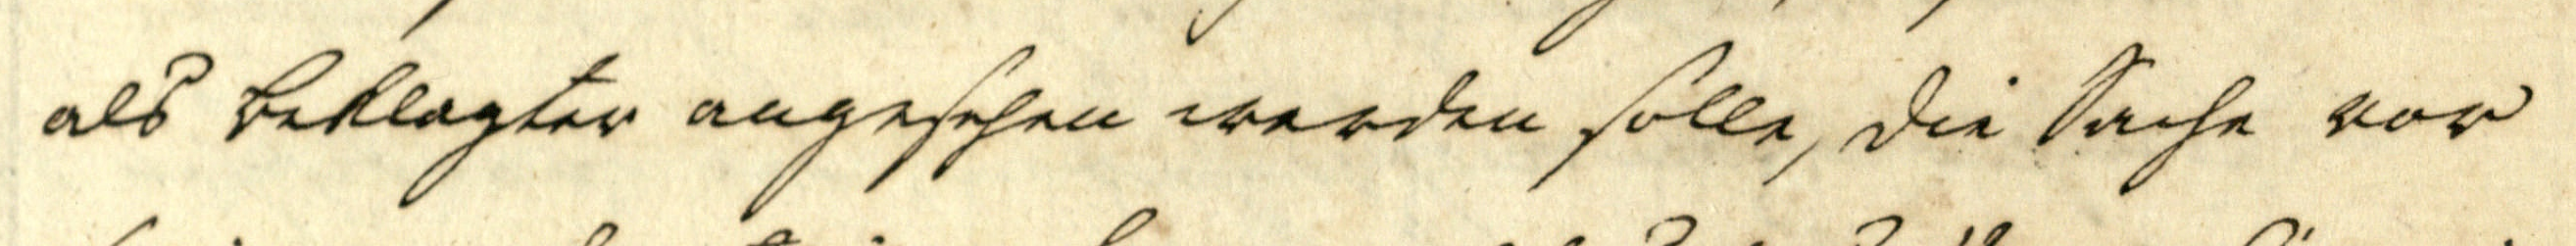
als Beklagter angesehen werden solle, die Sache vor
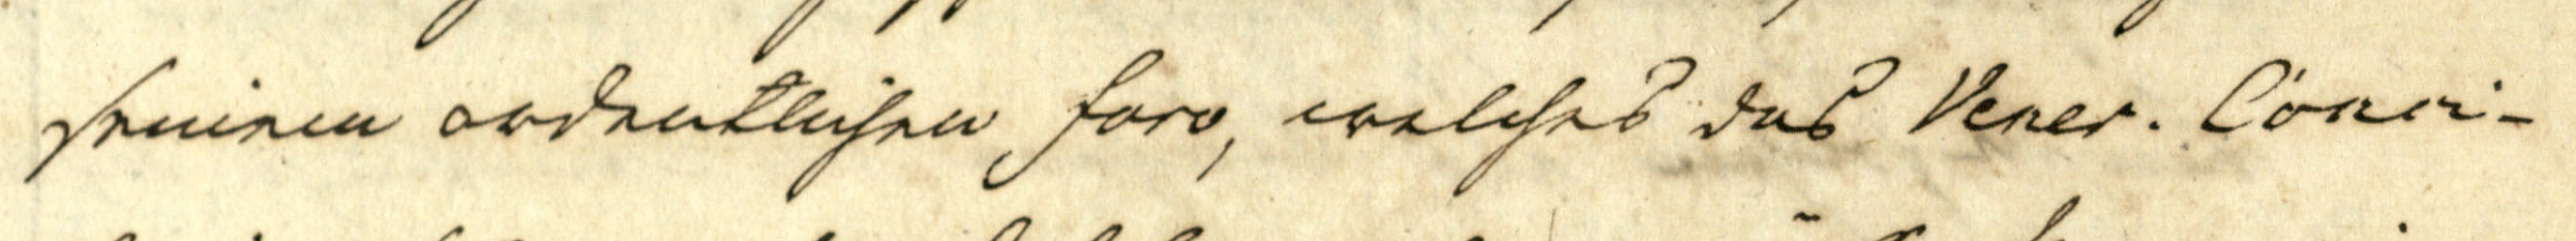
seinem ordentlichen foro, welches das Vener. Conci¬
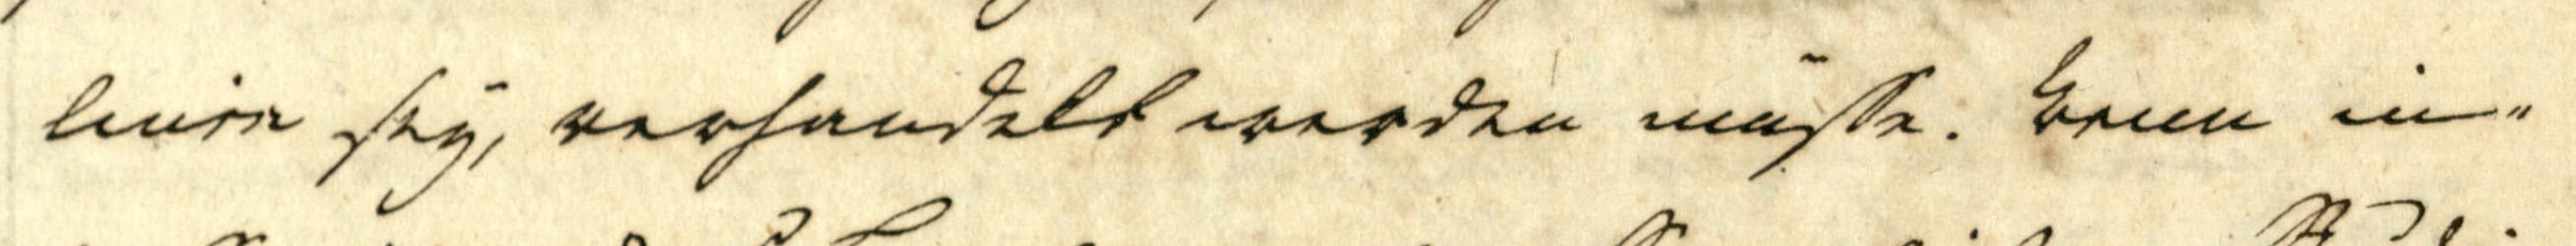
lium seÿ, verhandelt werden müsse. Wenn in¬
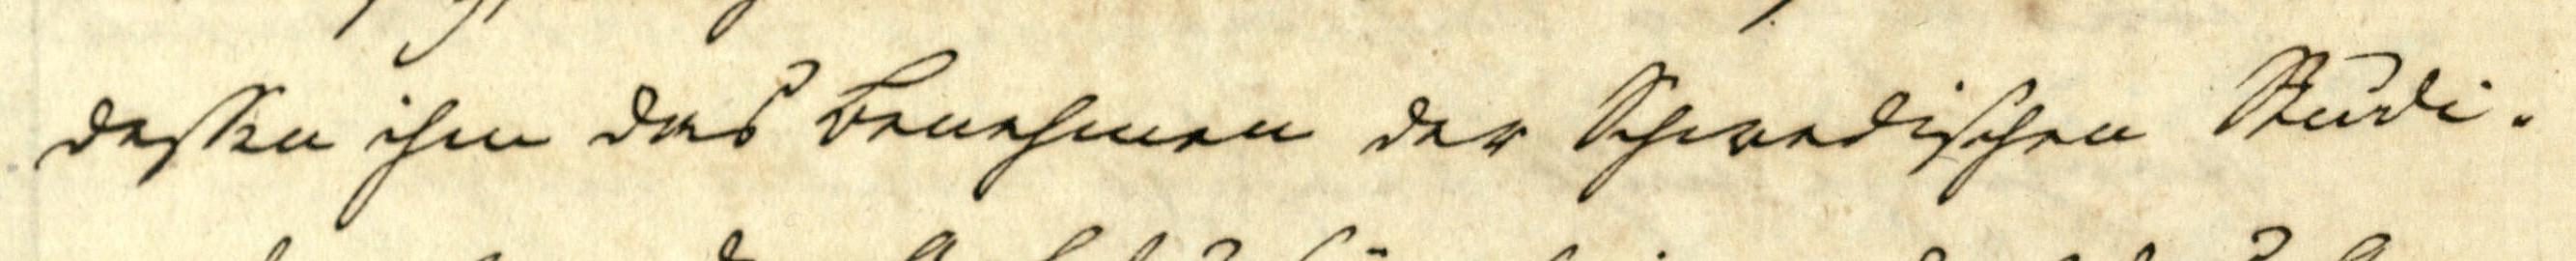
dessen ihm das Benehmen der Schwedischen Studi¬
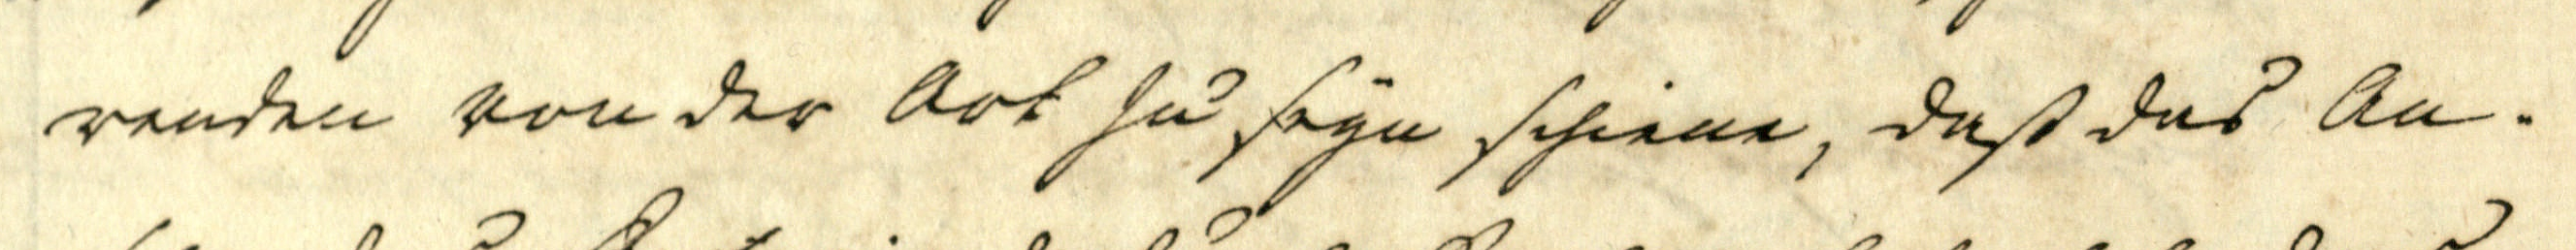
renden von der Art zu seÿn schiene, daß das An¬
